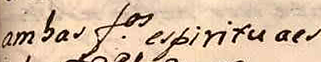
ambas f.as espirituaes
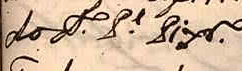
do d̄.o P.e Pixr.o
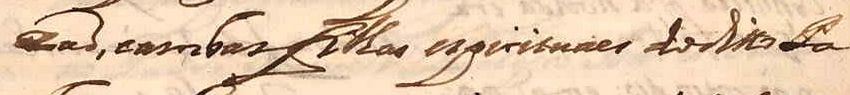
zaõ, e ambas filhas espirituaes do ditto Pa
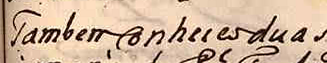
Tambem conheceo duas
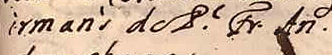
irmans do P.e Fr. An.to
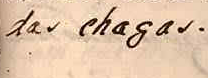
das chagas.
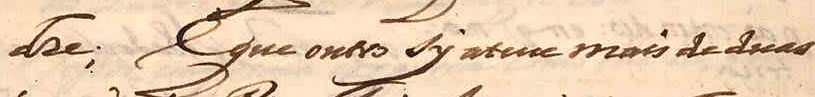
dre; E que outrosy a teue mais de duas
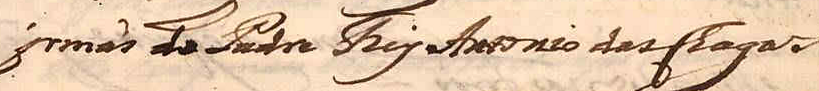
jrmās do Padre Frey Antonio das Chagas
